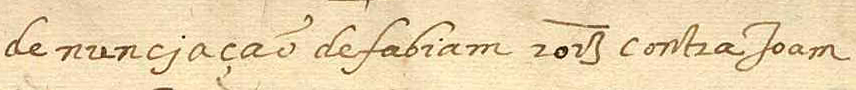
denuncjaçaõ de fabiam rōiz contra Joam
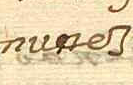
nunez
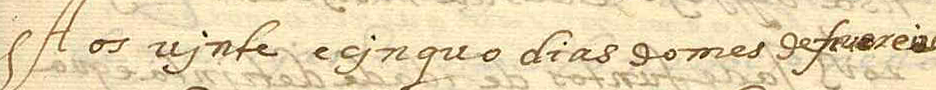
Aos ujnte e cjnquo dias do mes de feuereiro
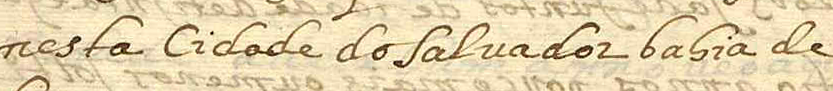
nesta Cidade do Saluador bahia de
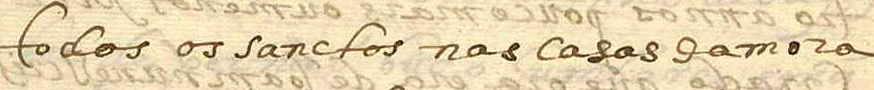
todos os sanctos nas casas da mora
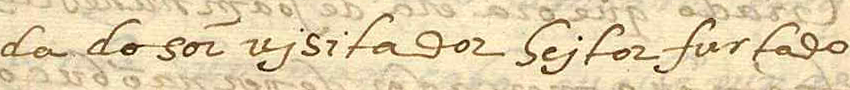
da do sor̄ ujsitador hejtor furtado
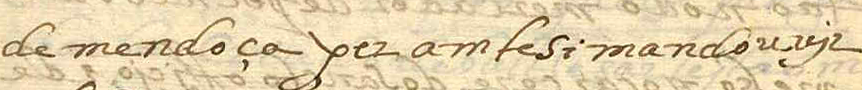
de mendoça per amte si mandou ujr
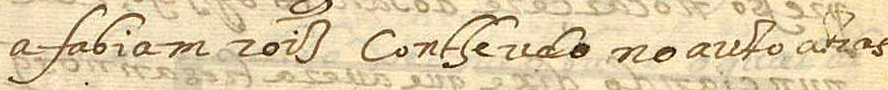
a fabiam roīz contheudo no auto atras
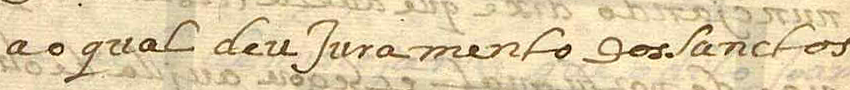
ao qual deu Juramento dos Sanctos
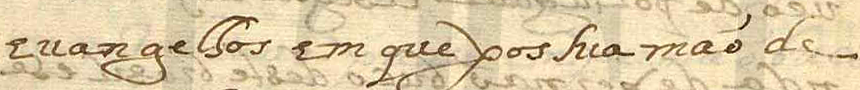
Euangelhos Em que pos sua maõ de
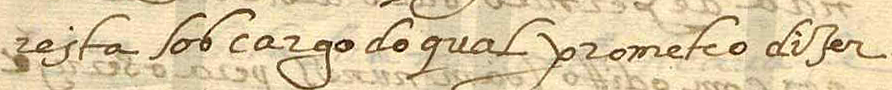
rejta sob cargo do qual prometeo dizer
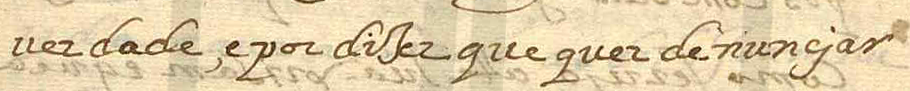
uerdade, e por dizer que quer denuncjar
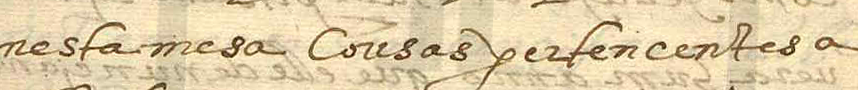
nesta mesa Cousas pertencentes a
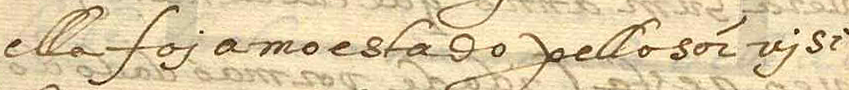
ella foj amoestado pello sor̄ ujsi
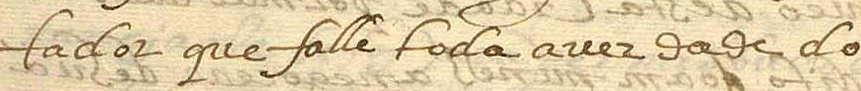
tador que falle toda a uerdade do
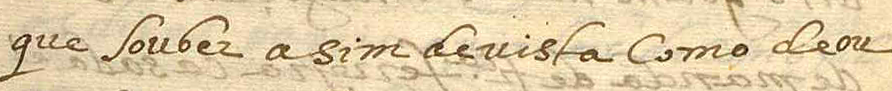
que souber assim de uista como de ou
